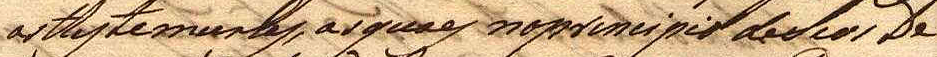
as thestemunhas, as quaes no principio de Seos De
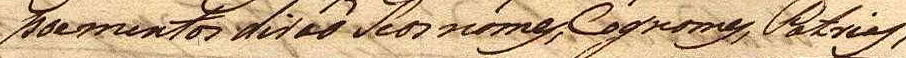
poementos diraõ seos nomes, Cognomes, Patrias,
